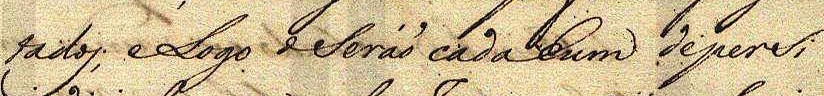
tados; e Logo o seraõ cada hum de per si
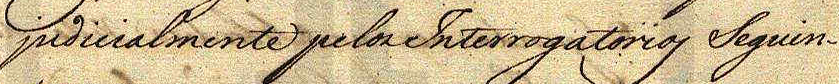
judicialmente pelos Interrogatorios seguin
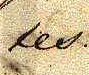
tes.
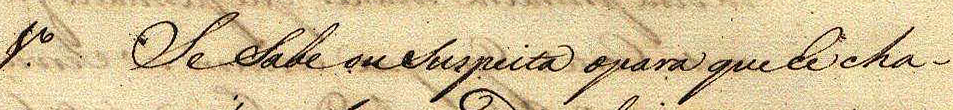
1.o Se Sabe ou suspeita o para que he cha
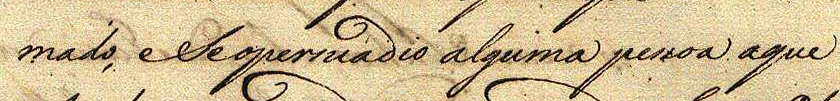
mado, e se o persuadio alguma pessoa a que
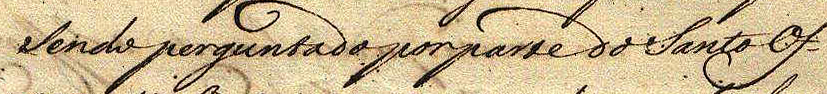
sendo perguntado por parte do Santo Of
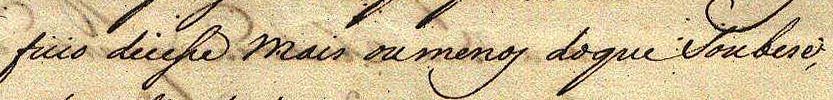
ficio dicesse mais ou menos do que soubese,
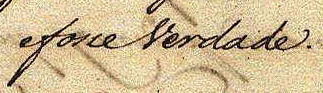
e fosse verdade.
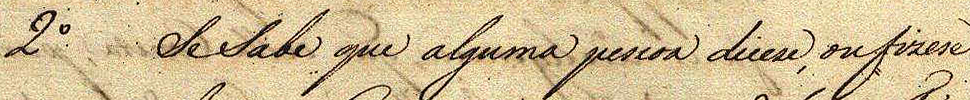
2.o Se Sabe que alguma pessoa dicese, ou fizese
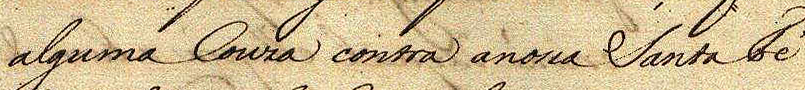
alguma Couza contra a nossa Santa Fé
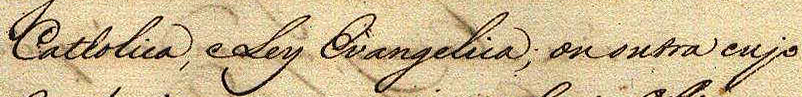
Catholica, e Ley Evangelica; ou outra cujo
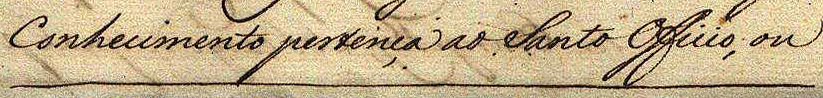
Conhecimento pertença ao Santo Officio, ou
